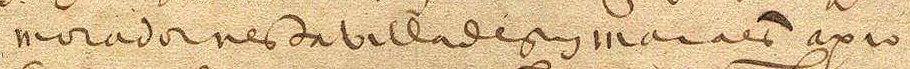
morador nesta villa de gujmaraẽs apro
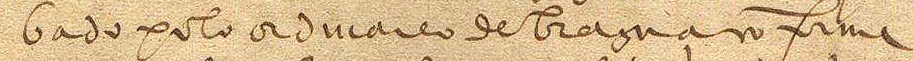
bado polo ordinareo de bragua cōforme
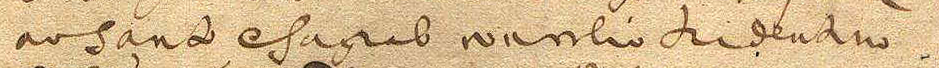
ao santo e sagrado concilio tridentino
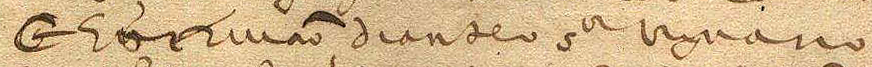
E Escriuaõ diante o sor viguairo
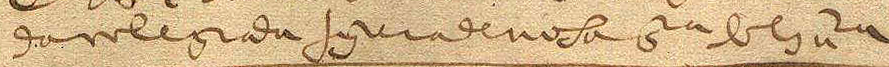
da colegiada Jgreia de nosa sra doljura
